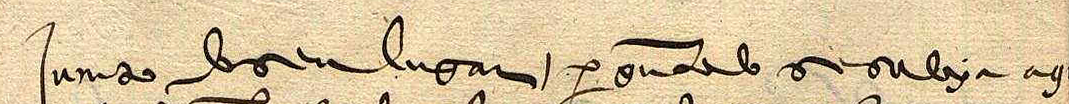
Jumto do seu lugar / ꝑgūtado se sabya a q
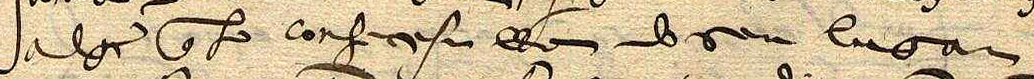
algē q̄ ho conhecese lla do seu lugar
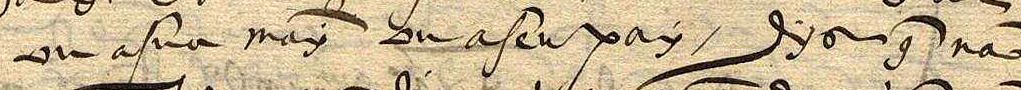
ou a sua maỹ ou a seu pay / dyse q̄ não
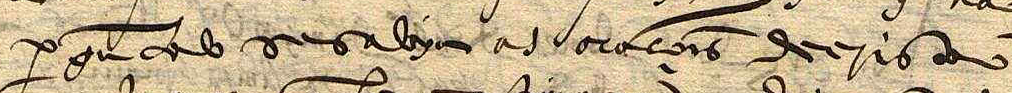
ꝑḡutado se sabya as orações de cristaõ
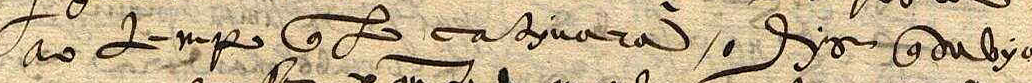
ao tempo q̄ ho catiuarā / dyse q̄ sabya
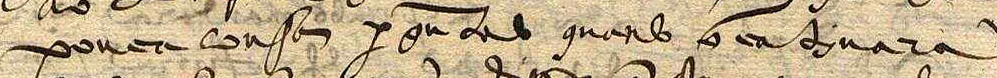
pouca cousa ꝑgūtado quando o catyuarā
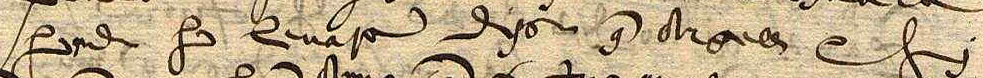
honde ho leuarā dyse q̄ Argell e hy
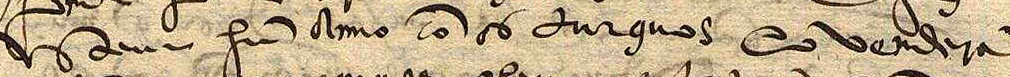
esteue hū Anno cō os turquos e o venderā
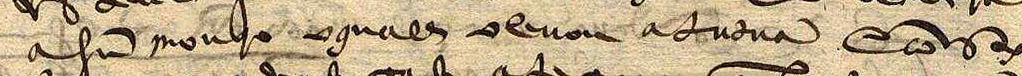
a hū mouro o quall o leuou a tutuā e cō este
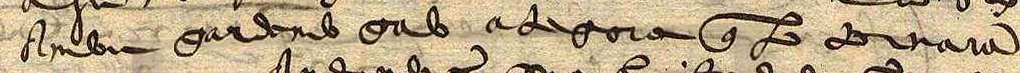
Amdou gardando gado ate gora q̄ ho tornarā
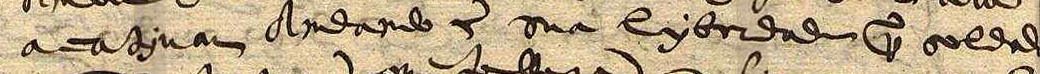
a catyuar Andando ē sua lyberdade p̄o soldad
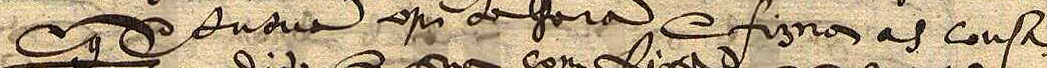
e q̄ ē tutuā o retalharā e fizera as cousas
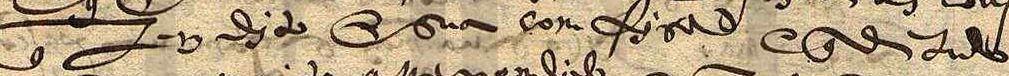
q̄ tem dyto ē sua comfysā e q̄ de tudo
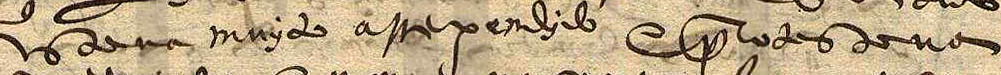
estaua muyto arrependydo e protestaua
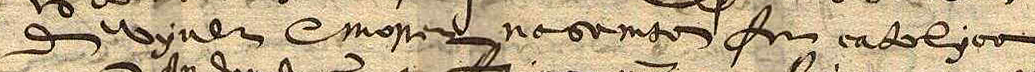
de vyuer e morrer na samta fee catolyca
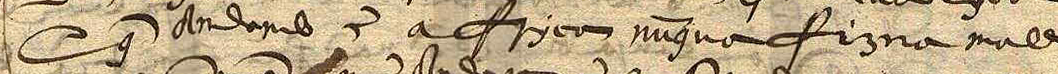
e q̄ Andando ē afryca nūqua fizera mall
